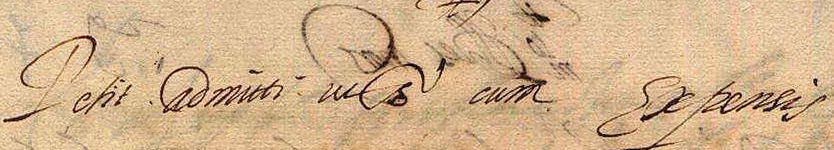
Petit admitti ut s̄ cum Expensis
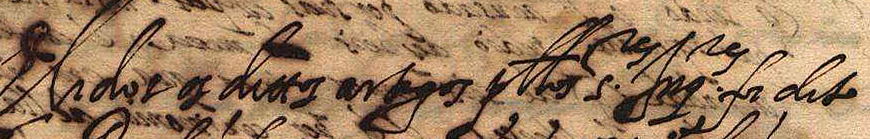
E lidos os dittos artigos pll̄os s.rs Jnq.res foi dito
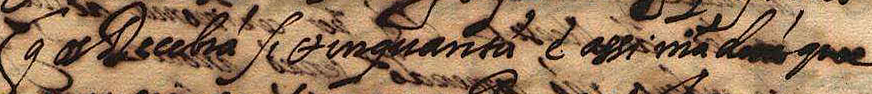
q̄ os Recebia si et in quantū e assi mādou que
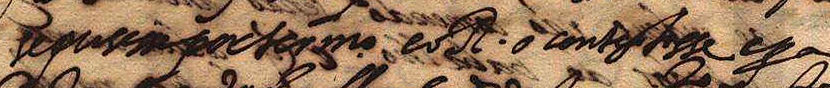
se pusese por termo e o R. o contestasse e ꝑa
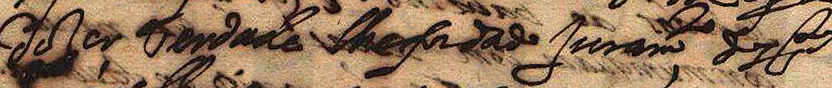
dizer verdade lhe foi dado Juramto dos stos
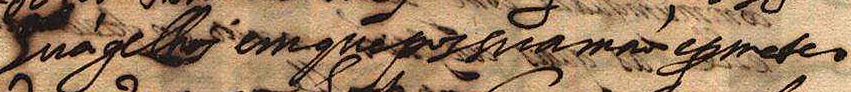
Euāgelhos em que pos sua maõ e ꝓmeteo
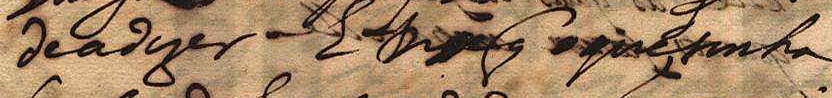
de a dizer E Dise q̄ o que tinha
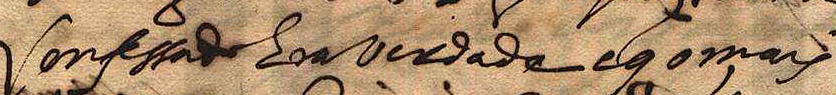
Confessado Era verdade e q̄ o mais
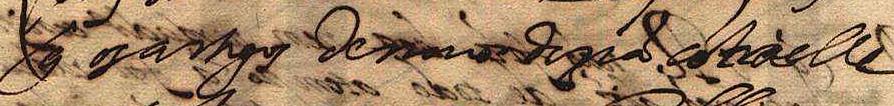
q̄ os artigos de nouo diziaõ cōtra elle
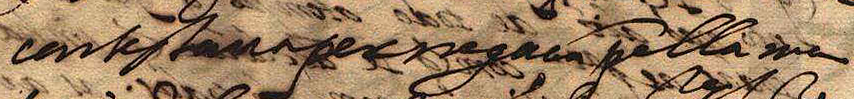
contestaua por negaçā pella ma
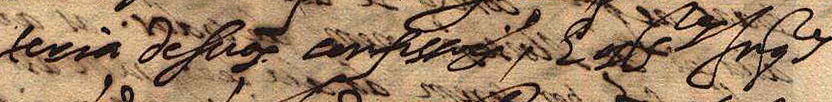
teria de suas confissoẽs, E os sres Jnqres
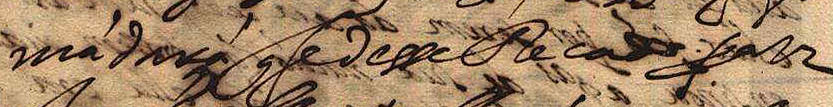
mādarā q̄ se desse Recado ꝑa ir
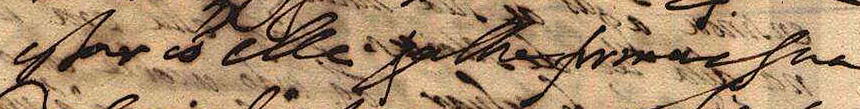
estar cō elle ꝑa lhe formar sua
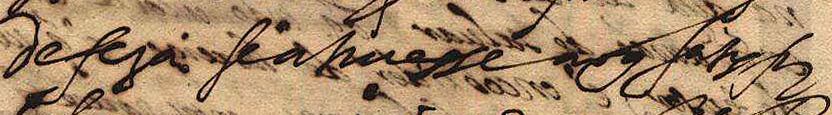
defeza se a tiuesse ao q̄ satisfiz
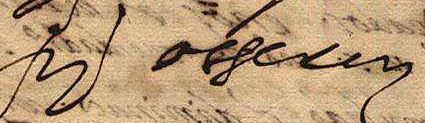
frz̄ o escreuj
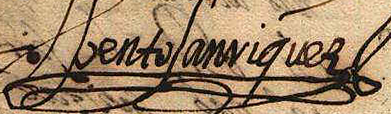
bento anriquez
